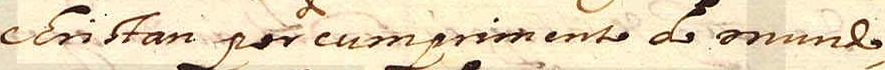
christan por cumprimento do mundo,
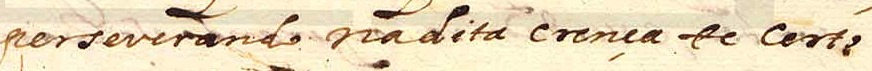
perseverando na dita crença te certo
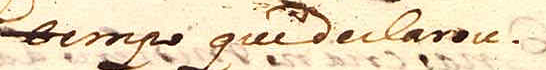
tempo que declarou.
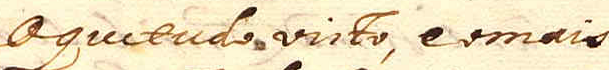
O que tudo visto, e o mais
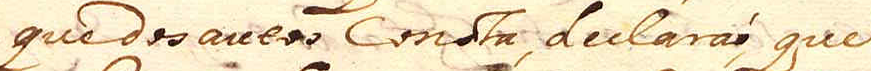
que dos autos Consta, declaraõ, que
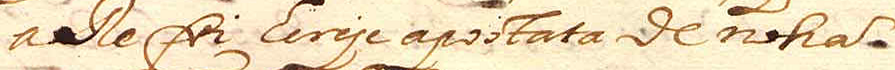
a Re foi hereje apostata de nossa
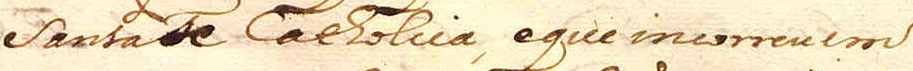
santa Fe Catholica, e que incorreu em
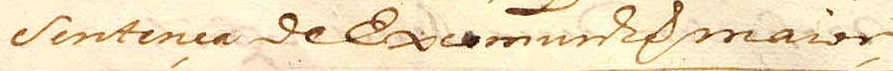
sentença de Excomunhaõ maior,
